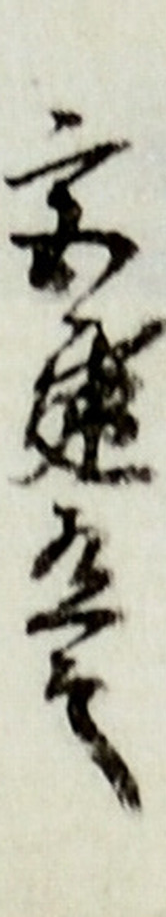宮建有之
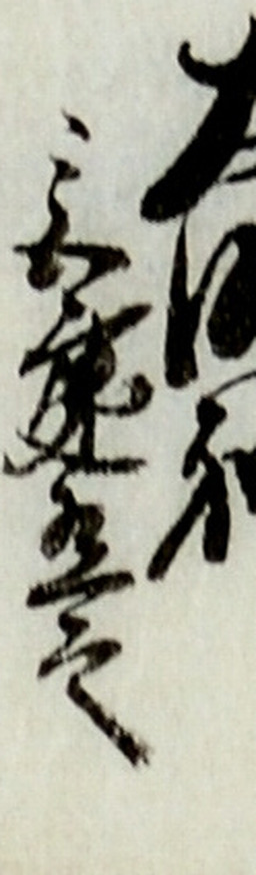宮建有之
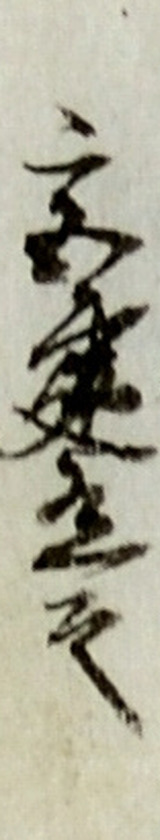宮建有之
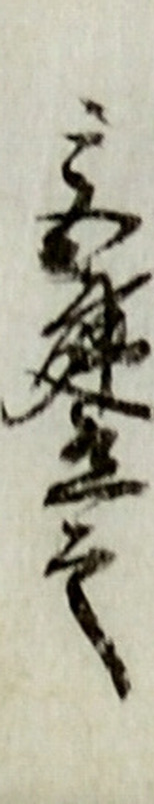宮建有之

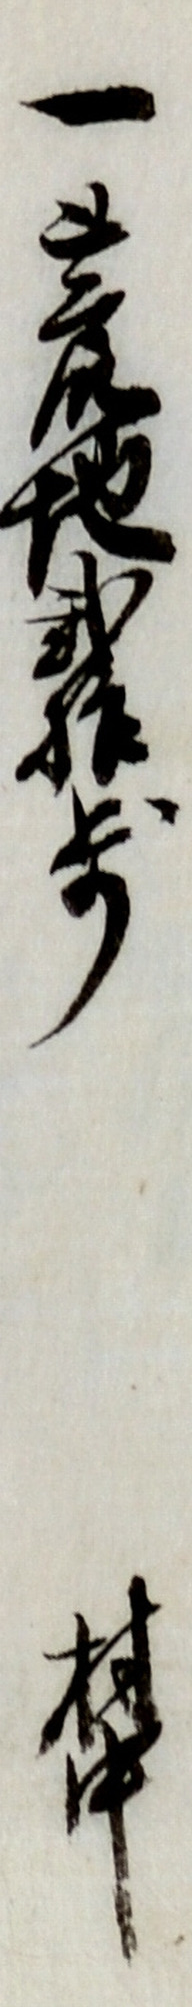一荒地弐拾歩村中
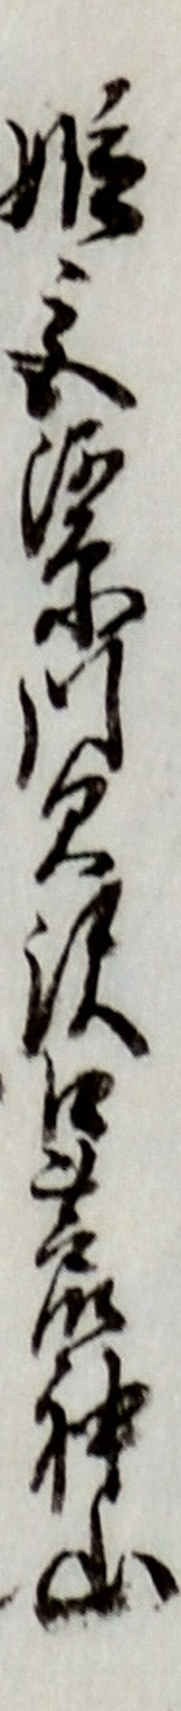姫宮河原川欠沢口荒神山
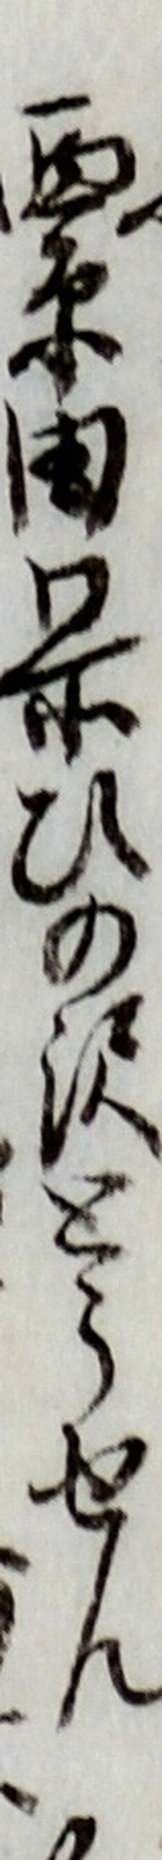西原田同所ひの沢とうせん
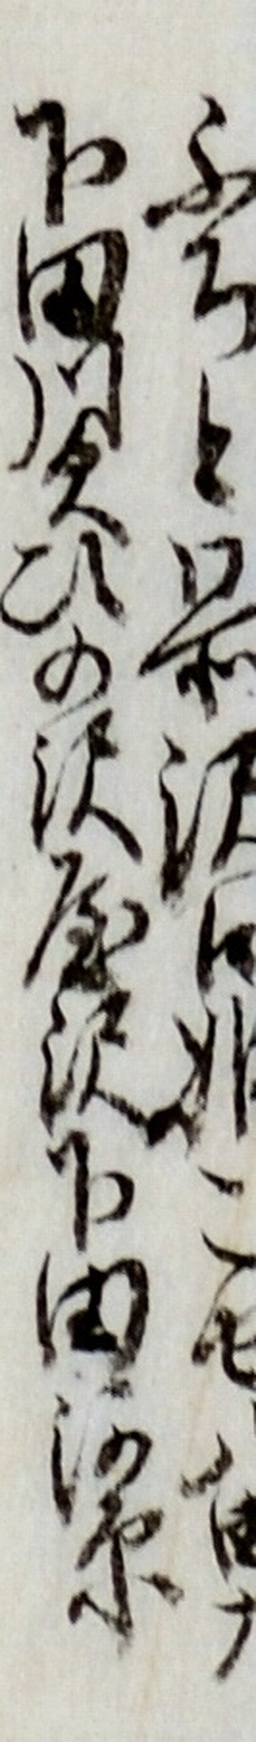下田川欠ひの沢屋沢下田河原
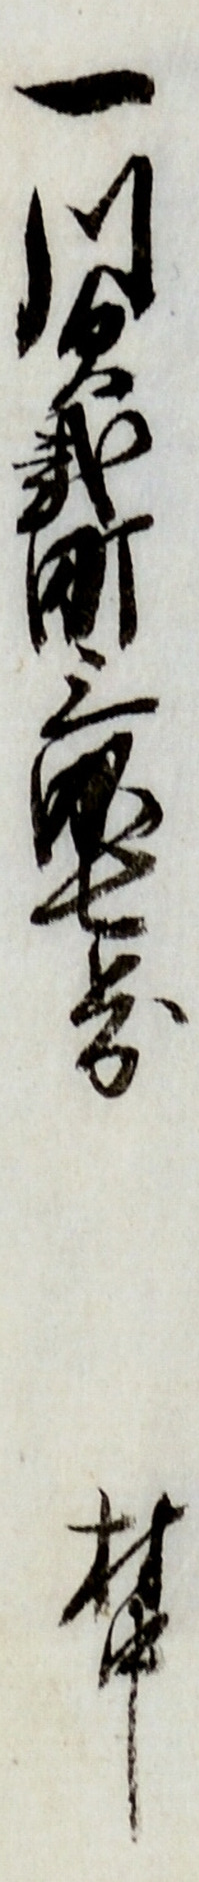一川欠弐町三畝七歩村中
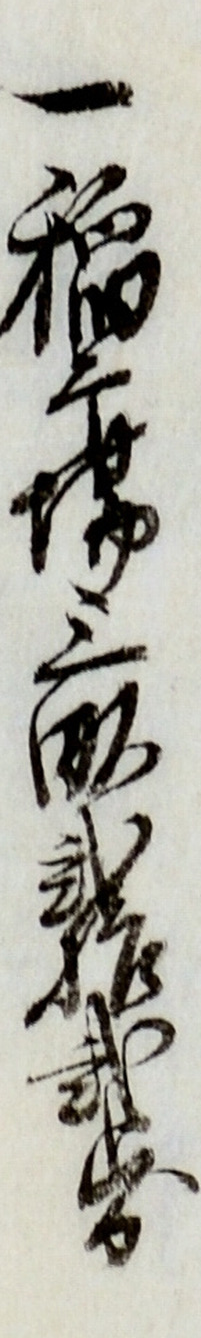一稲干場三畝弐拾弐歩
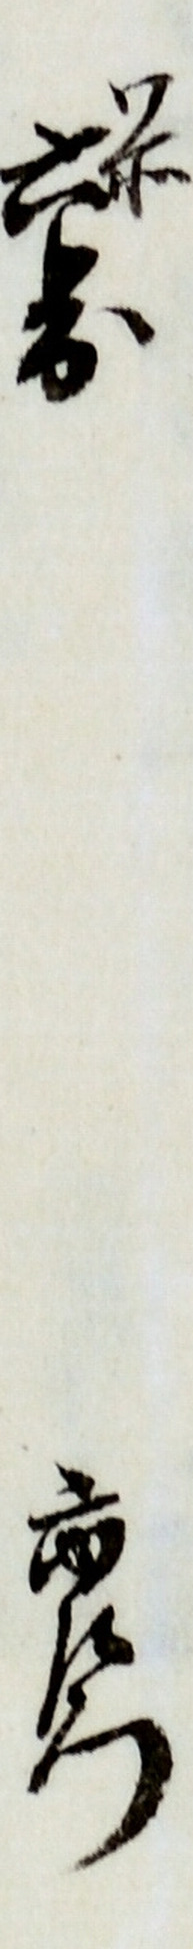六歩市左衛門
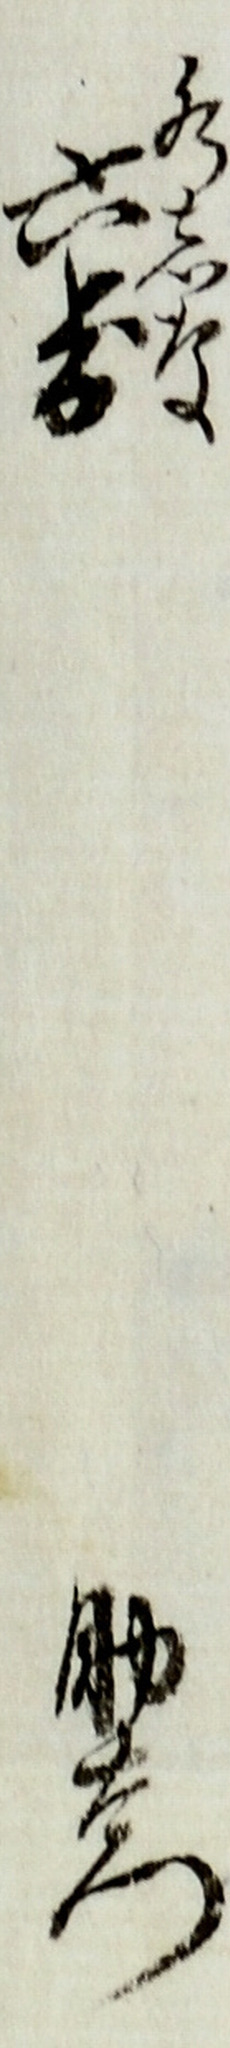六歩助右衛門
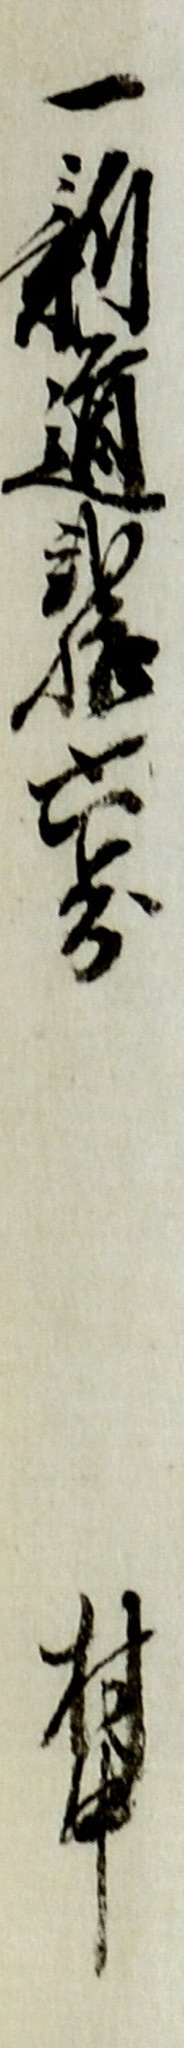一新道弐拾六歩村中
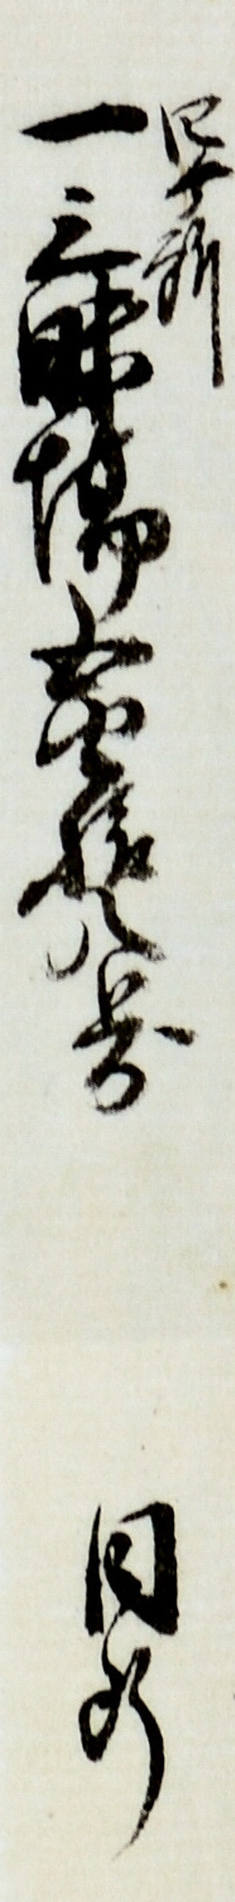一三昧場五セ拾八歩同断
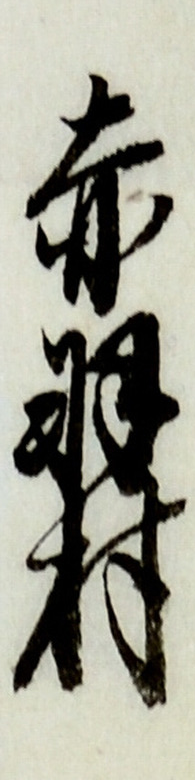赤羽村
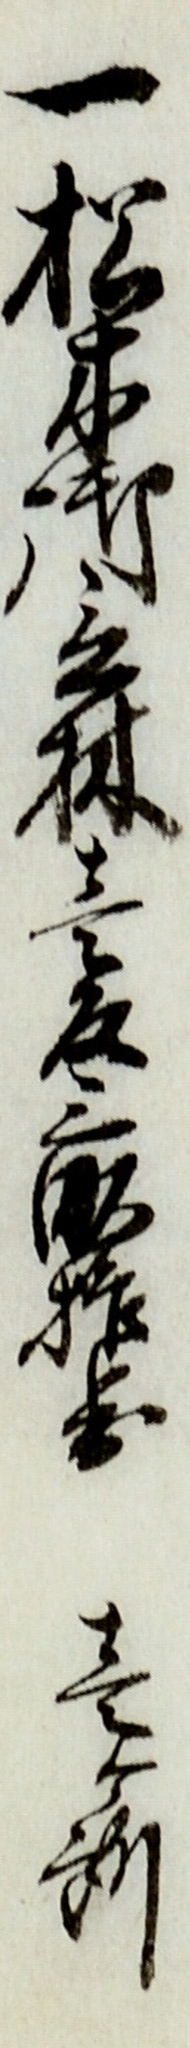一松木御立林壱反三畝拾歩壱ヶ所
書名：御領分中山林社地手控
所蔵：伊那市立高遠町図書館・合同会社AMANE
